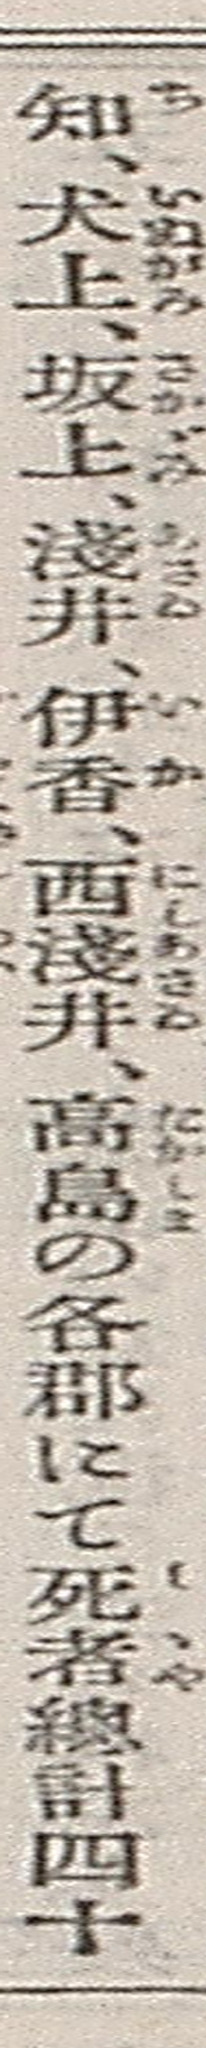知、犬上、坂上、浅井、伊香、西浅井、高島の各郡にて死者総計四十
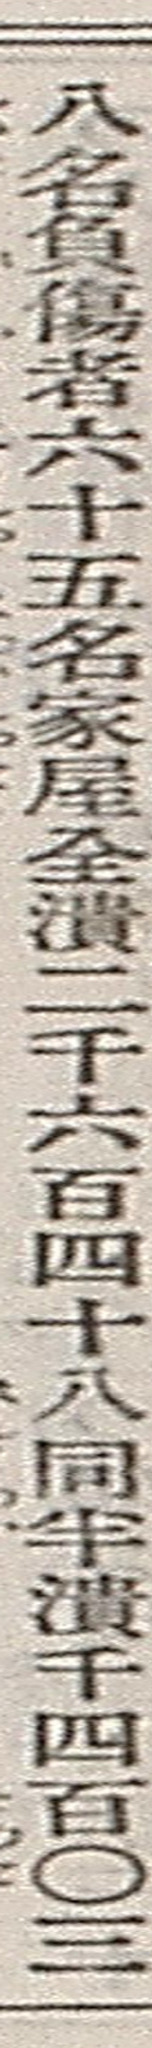八名負傷者六十五名家屋全潰二千六百四十八同半潰千四百０三
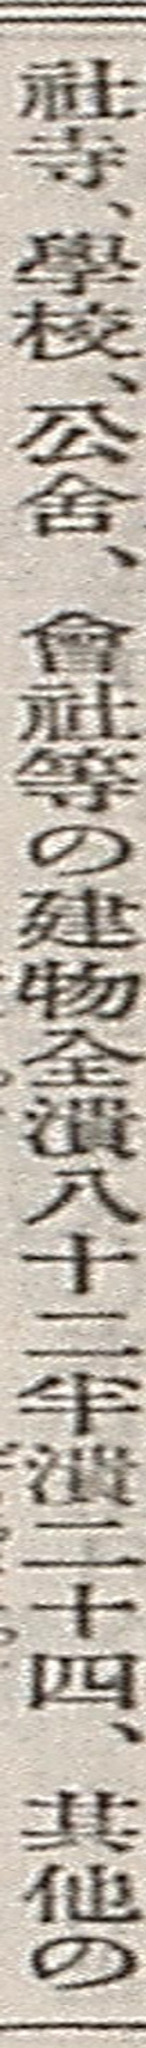社寺、学校、公舎、會社等の建物全潰八十二半潰二十四、其他の
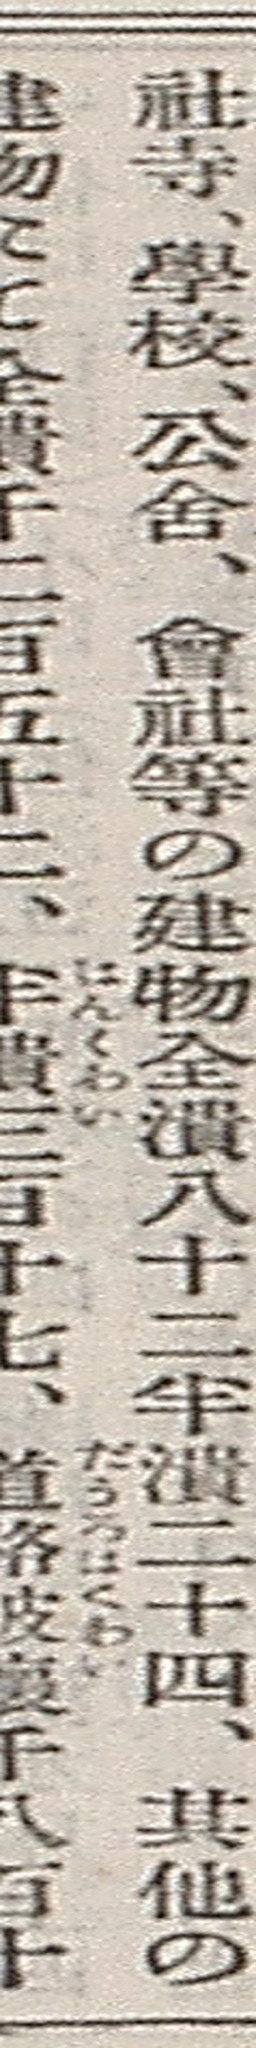建物にて全潰千二百五十二、半潰三百十七、道路破壊千八百十
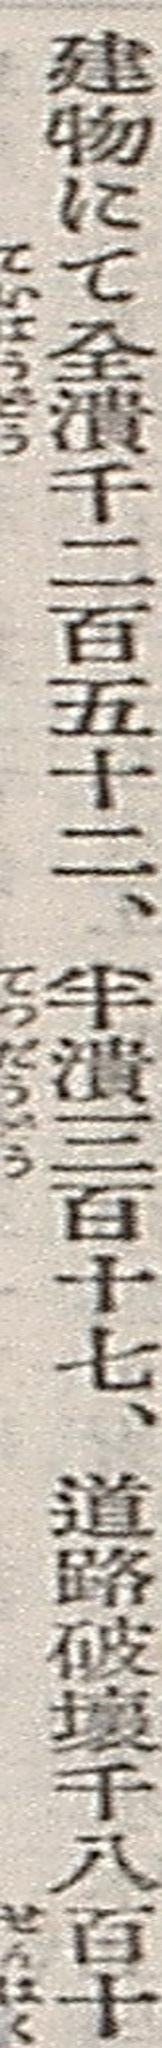建物にて全潰千二百五十二、半潰三百十七、道路破壊千八百十
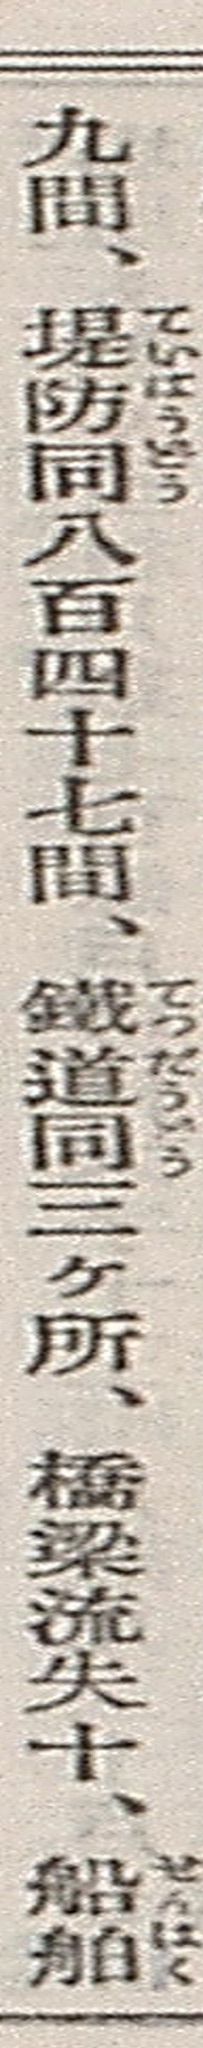九間、堤防同八百四十七間、鉄道同三ヶ所、橋梁流失十、船舶
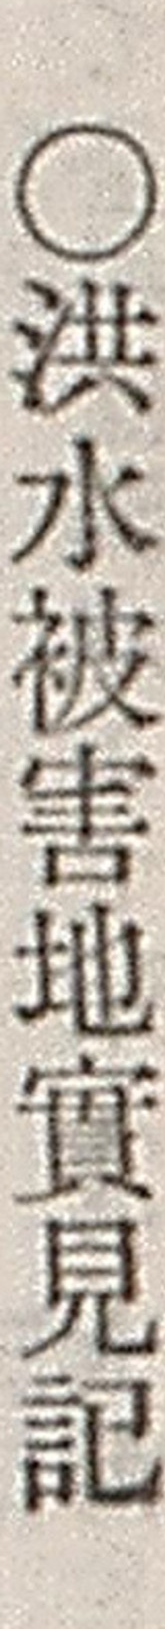◯洪水被害地実見記
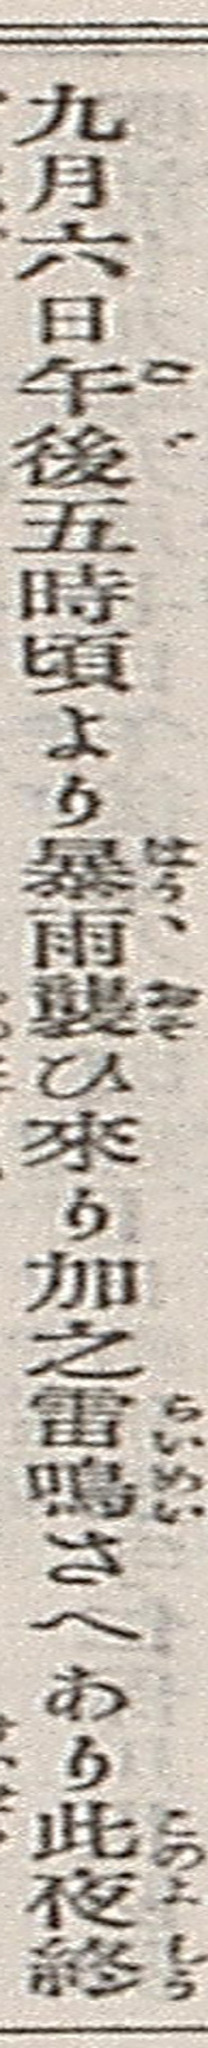九月六日午後五時頃より暴雨襲ひ来り加之雷鳴さへあり此夜終
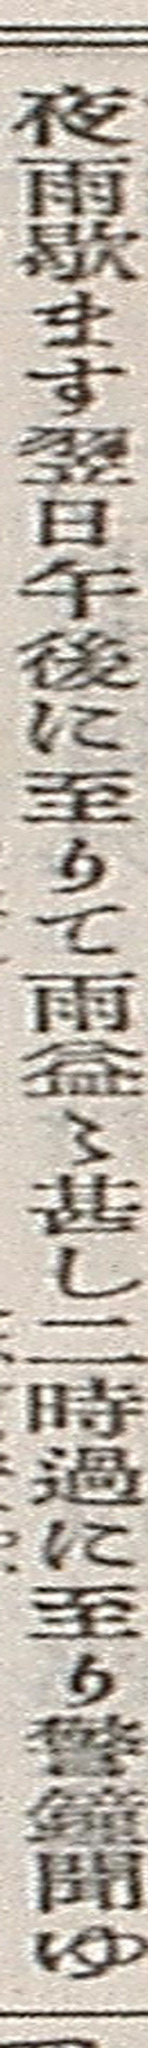夜雨歇ます翌日お後に至りて雨益々甚し二時過に至り警鐘聞ゆ
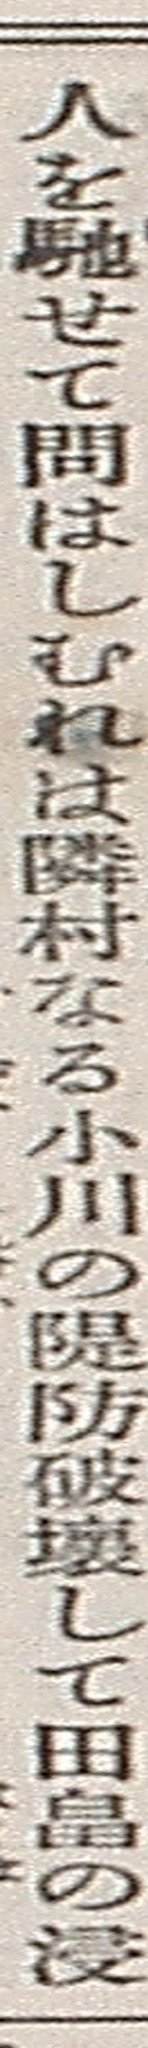人を馳せて問はしむれは燐村なる小川の堤防破壊して田畠の浸
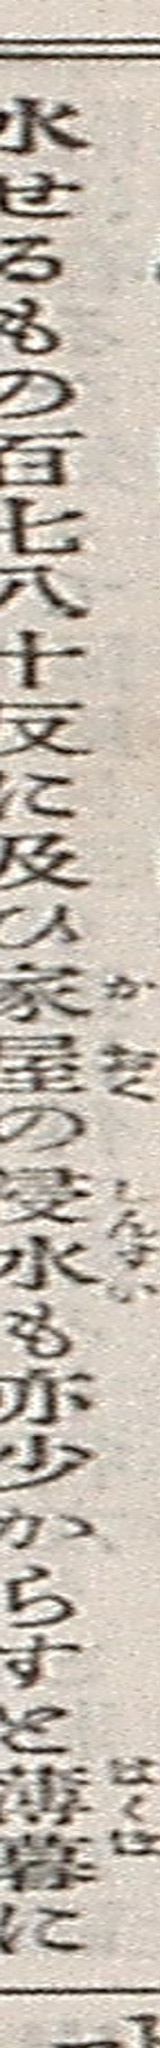いせるもの百七八十反に及ひ家屋の浸水も亦少からすと薄暮に
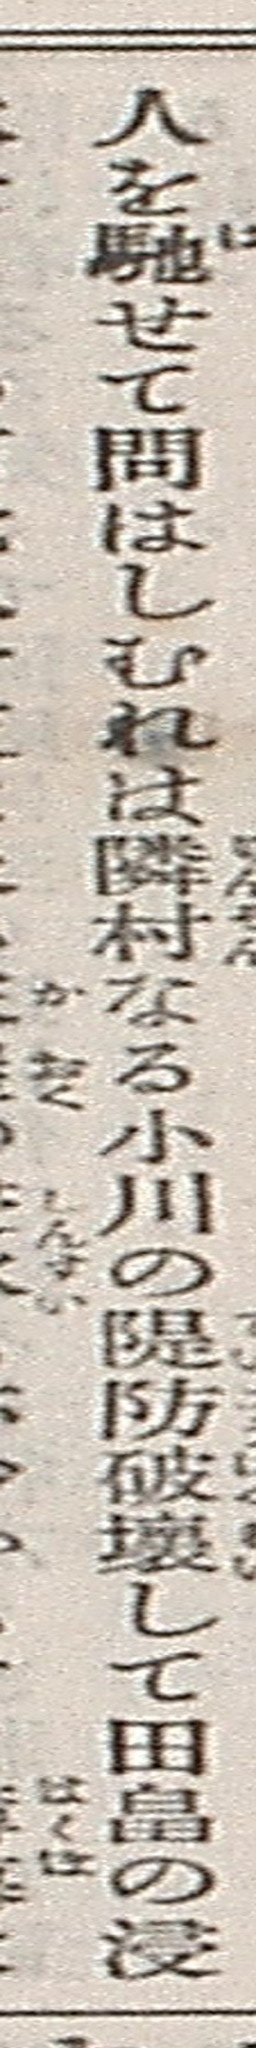人を馳せて問はしむれは燐村なる小川の堤防破壊して田畠の浸
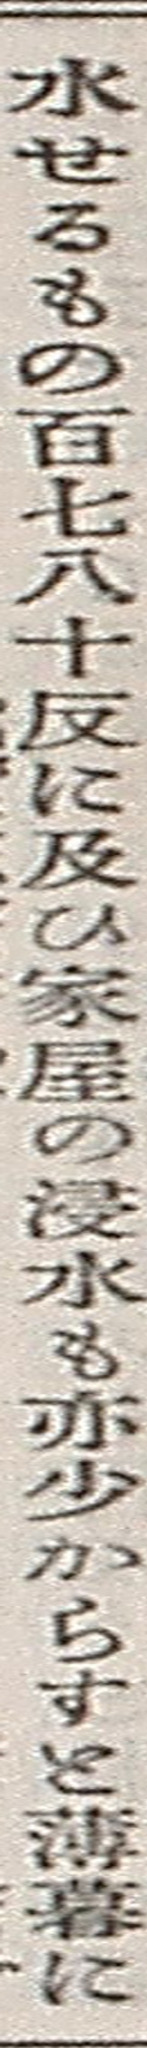いせるもの百七八十反に及ひ家屋の浸水も亦少からすと薄暮に
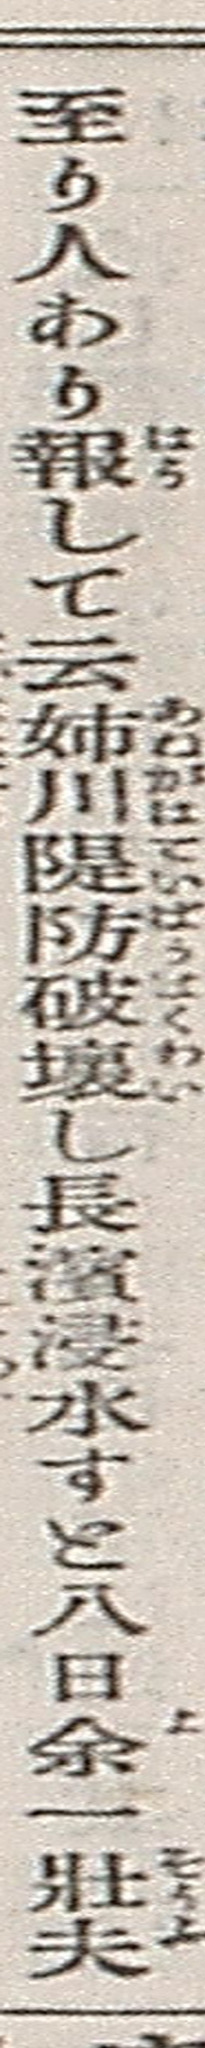至り人あり報して云姉川堤防破壊し長浜浸水すと八日余一壮夫
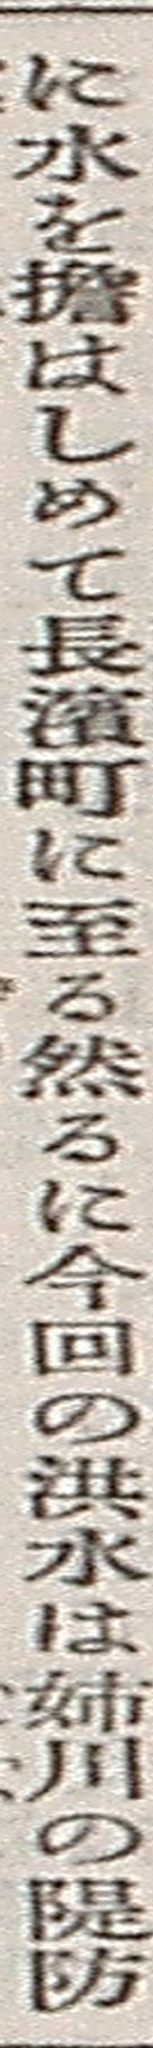に水を擔はしめて長浜町に至る然るに今回の洪水は姉川の堤防
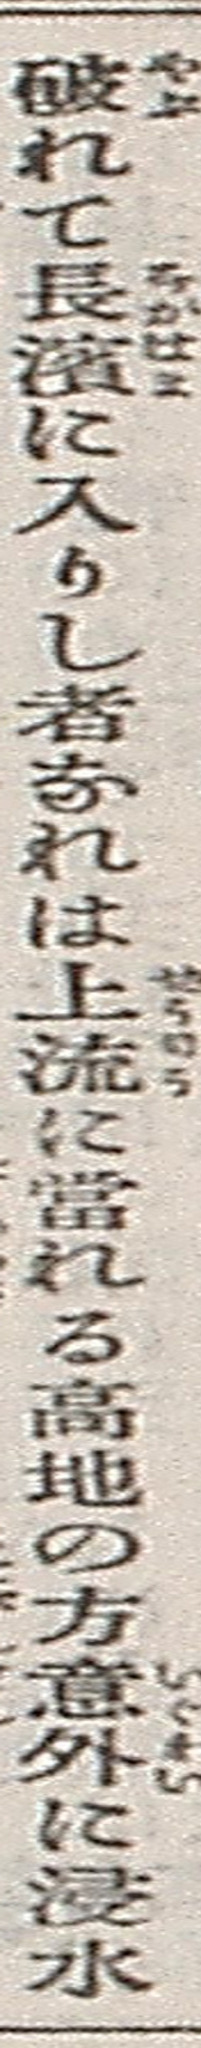破れて長浜に入りし者なれは上流に当れる高地の方意外に浸水
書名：風俗畫報臨時増刊第百二十八號　洪水被害録（下）
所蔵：東京大学地震研究所図書室 Earthquake Research Institute Library, The University of Tokyo, JAPAN
